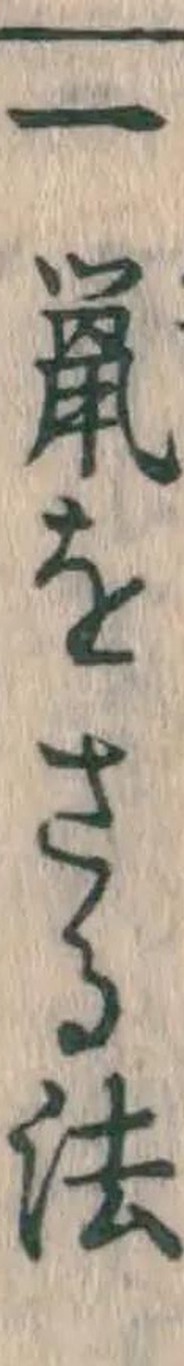一鼠をさる法
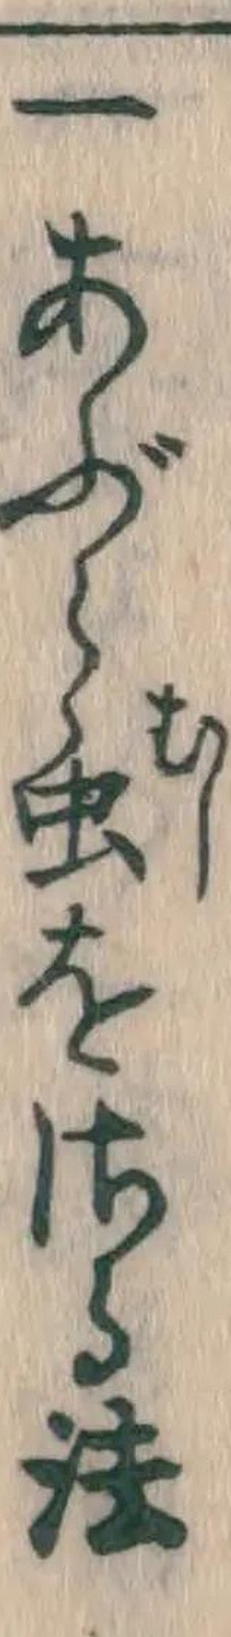一あぶら虫をさる法
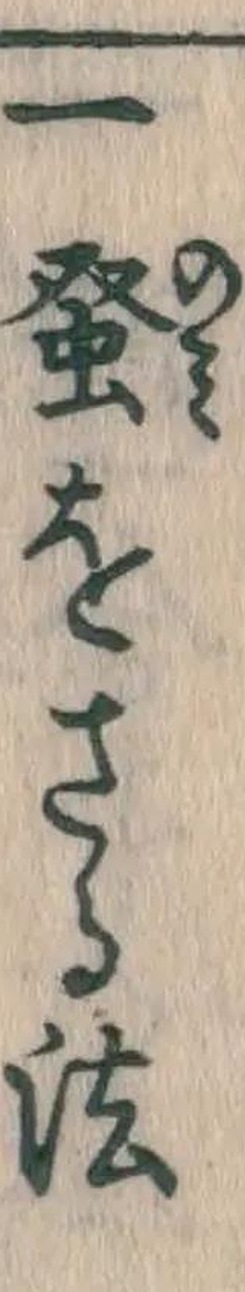一蚤をさる法
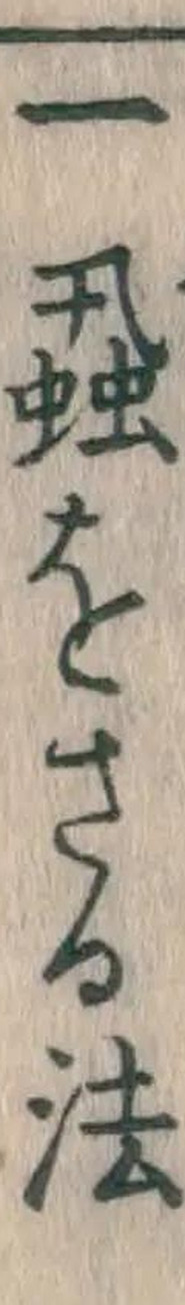一鼠をさる法
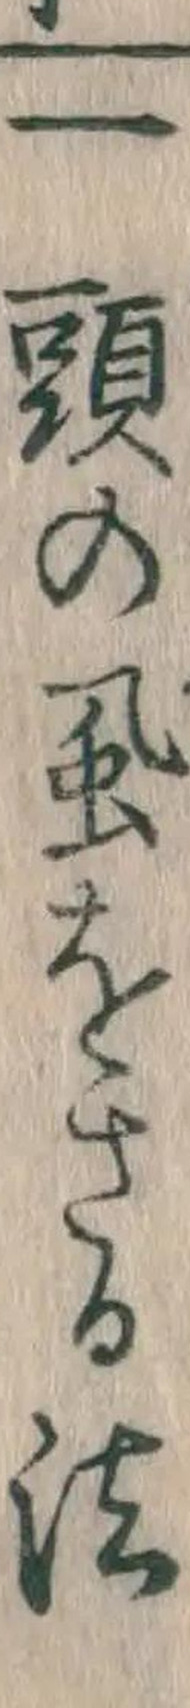一頭の蝨をさる法
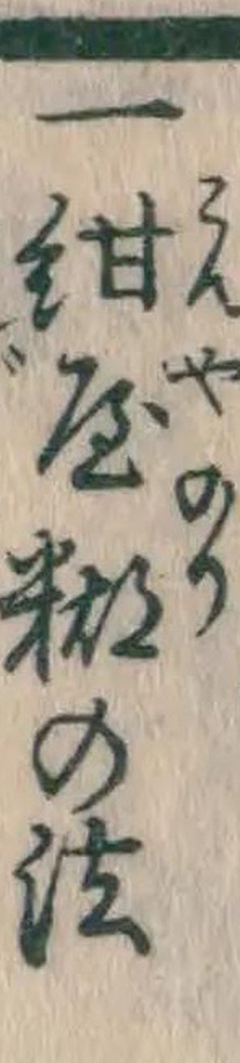一紺屋糊の法
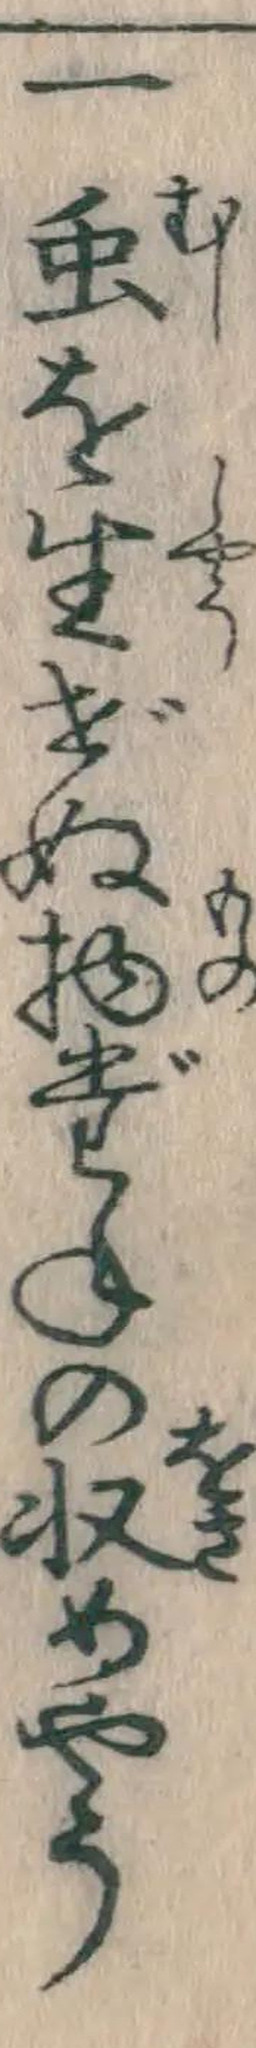一虫を生ぜぬ物だねの収めやう
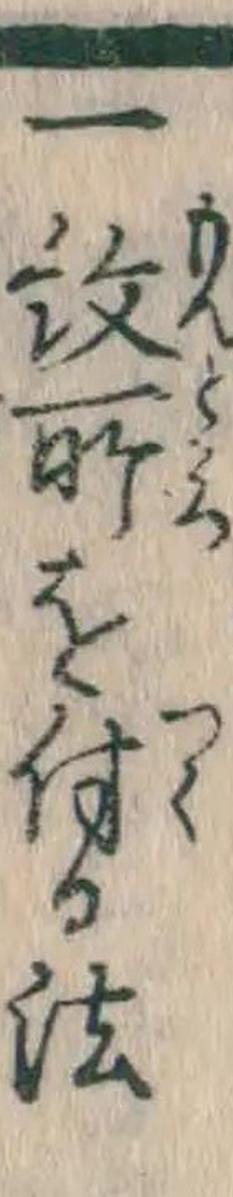一紋所を付る法
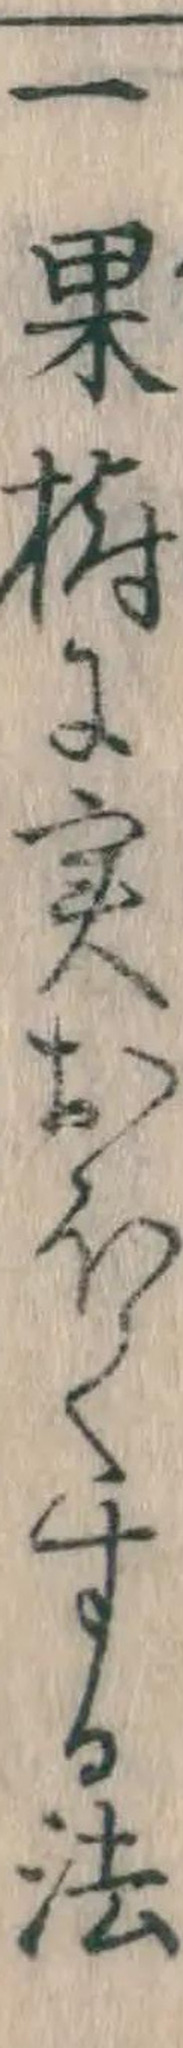一果樹に実おほくする法
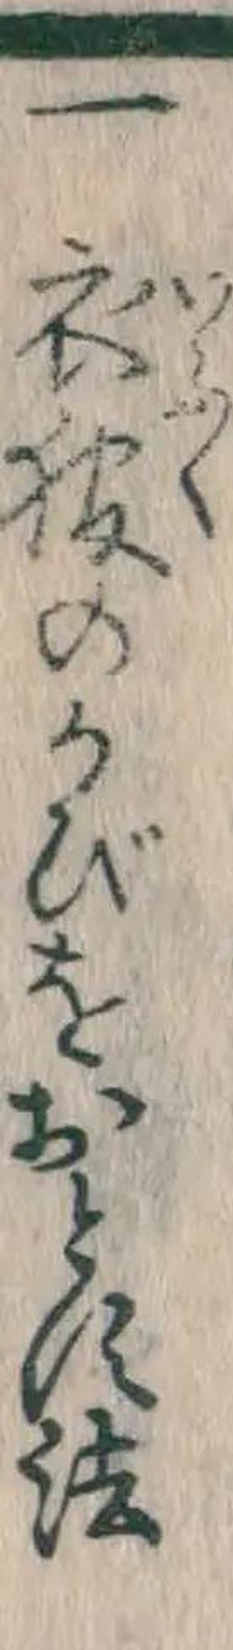一衣服のかびをおとす法
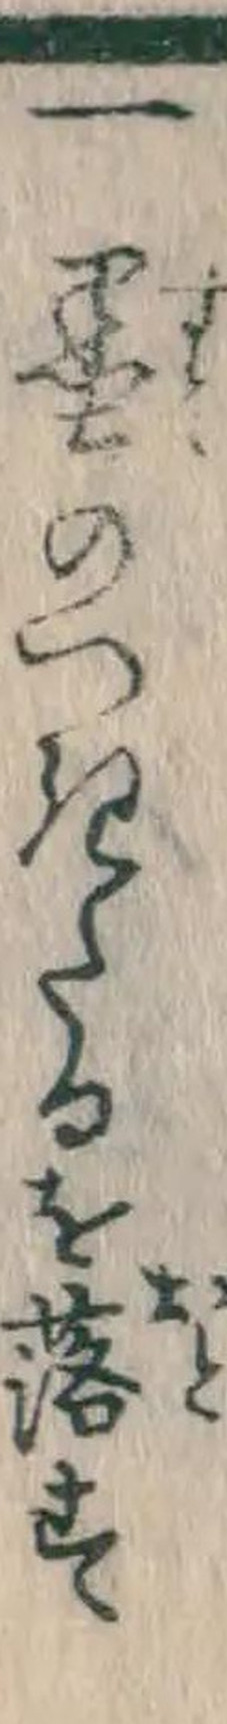一墨のつきたるを落す
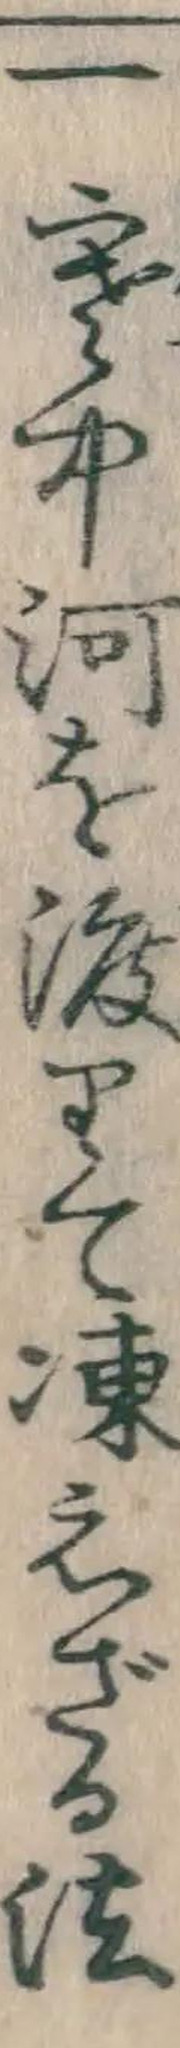一寒中河を渡りて凍えざる法
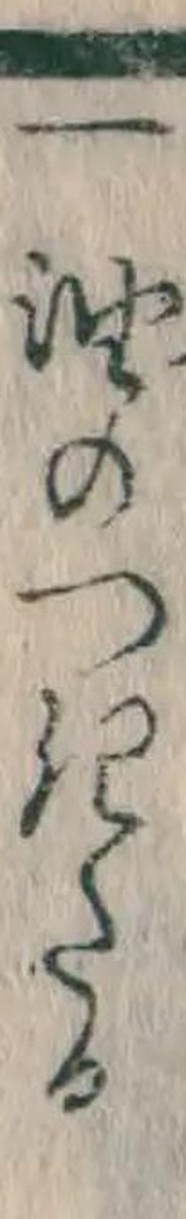一蠟のつきたる
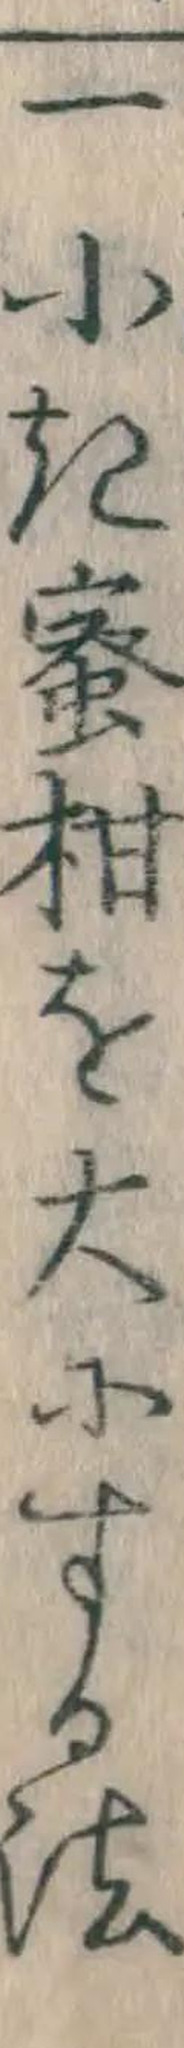一小き蜜柑を大にする法
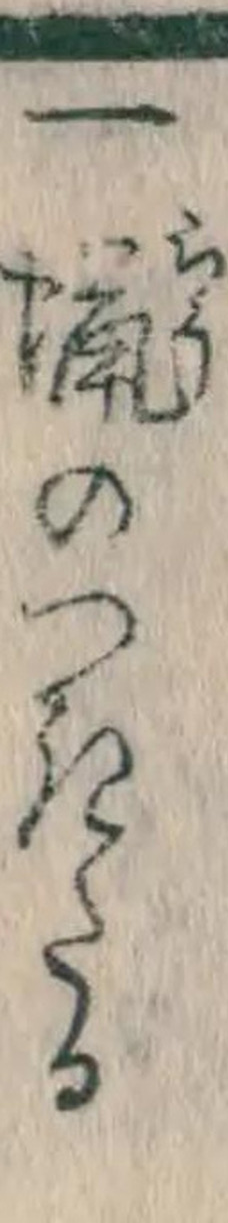一蠟のつきたる
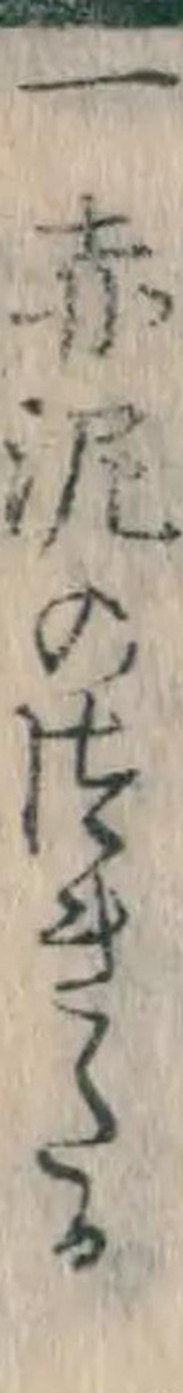一蠟のつきたる
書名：広益秘事大全 3巻. [1]
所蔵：国立国会図書館 National Diet Library, JAPAN
